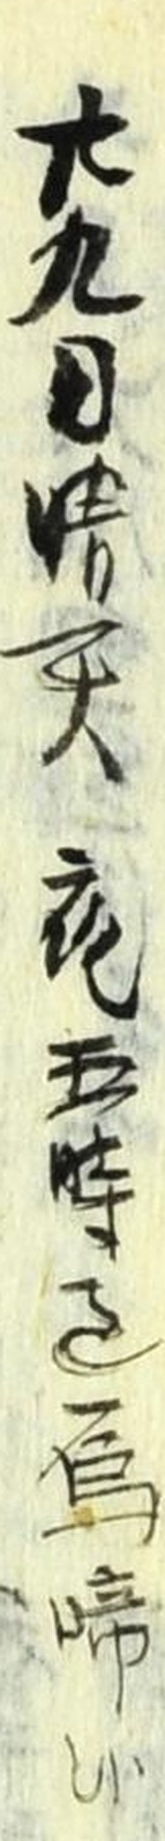廿九日晴天夜五時過烏啼候
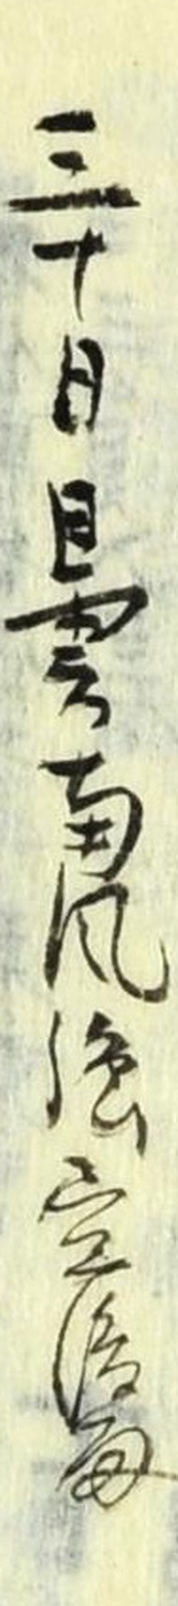三十日曇南風強昼後雨
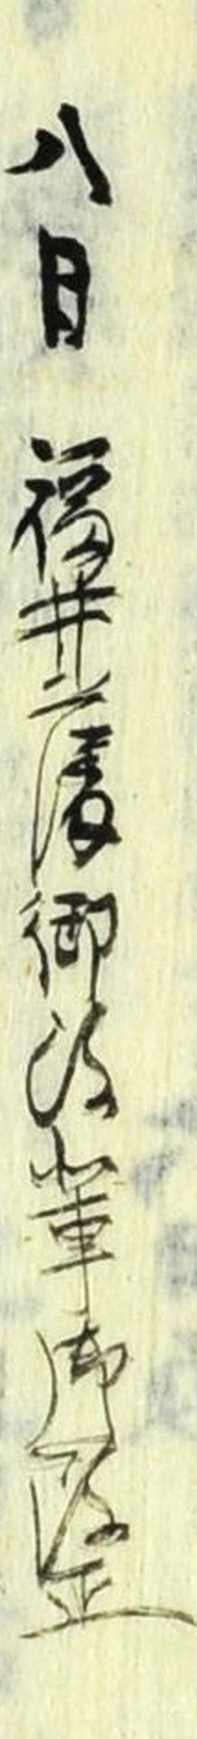八日福井藩御役輩御改正
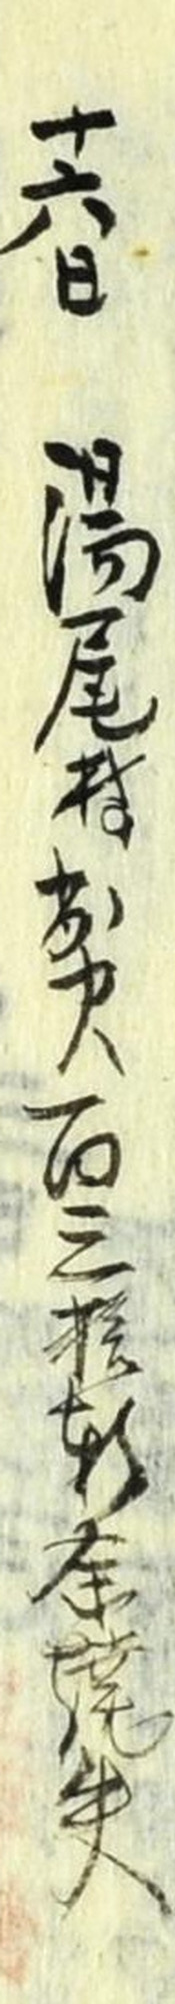十六日湯尾村出火百三拾軒余焼失

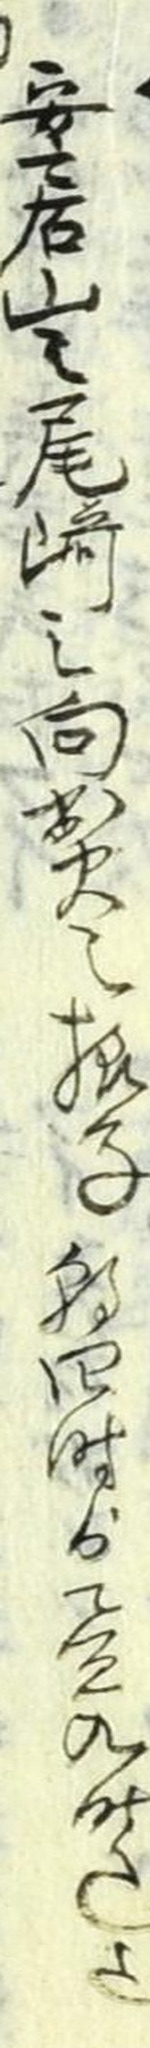安居山之尾崎之向出火之様子朝四時ゟ昼九時過迄
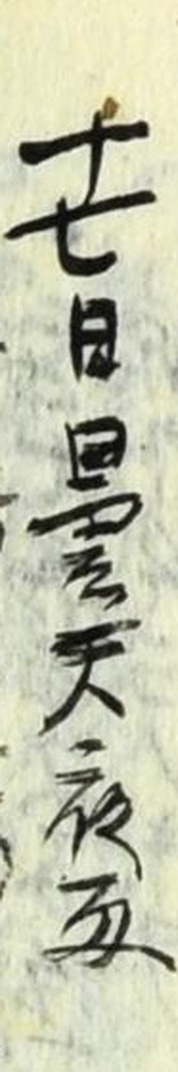十七日曇天夜雨
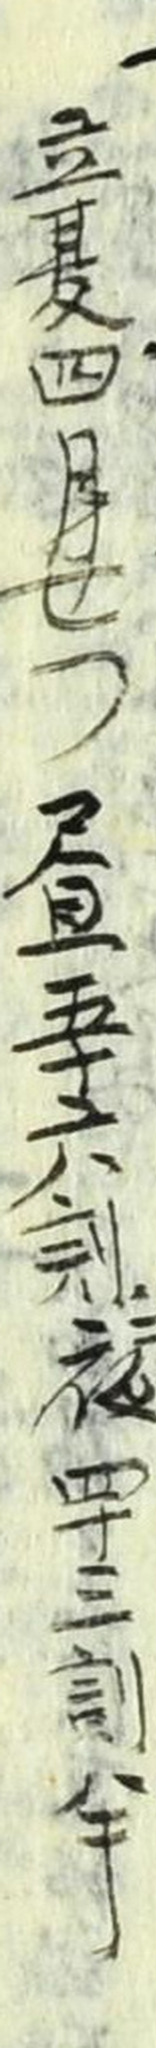立夏四月せつ昼五十六刻半夜四十三刻半
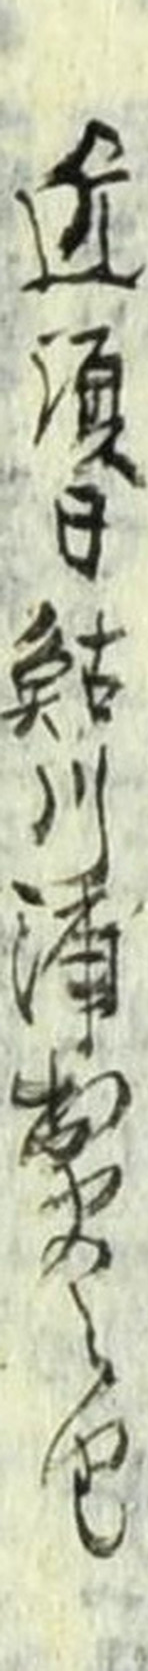近頃日鮎川浦出火之由
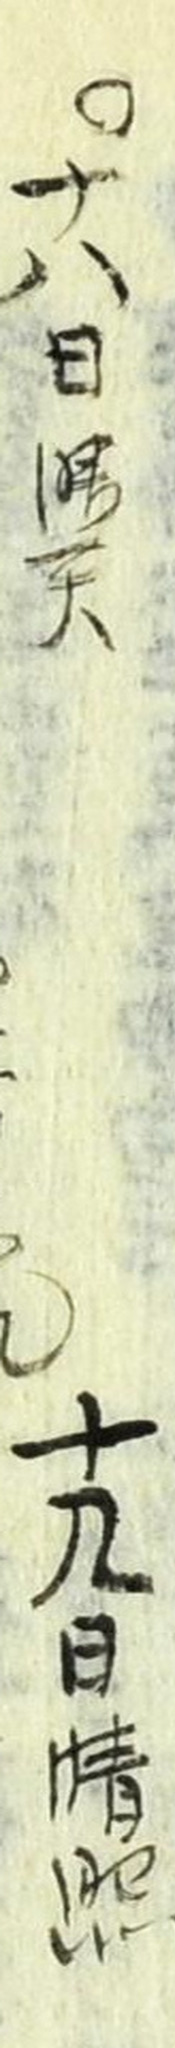○十八日晴天十九日晴照
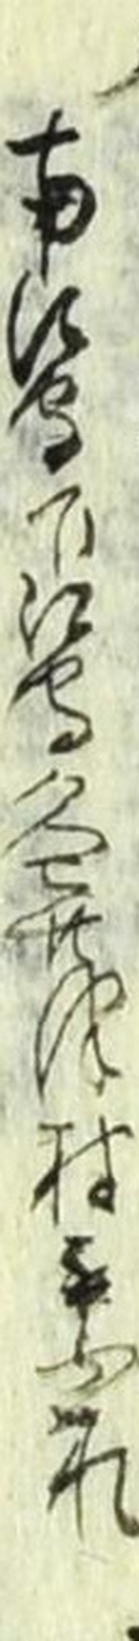南江守下江守久喜津村祭礼
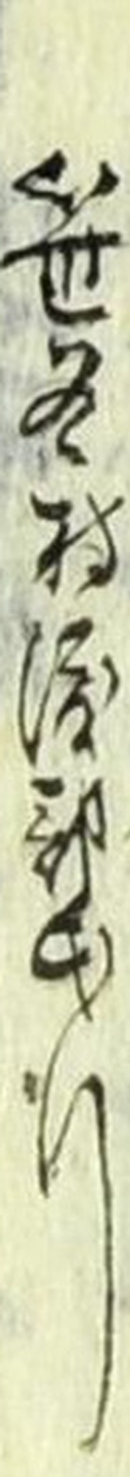笹谷村渡部氏行
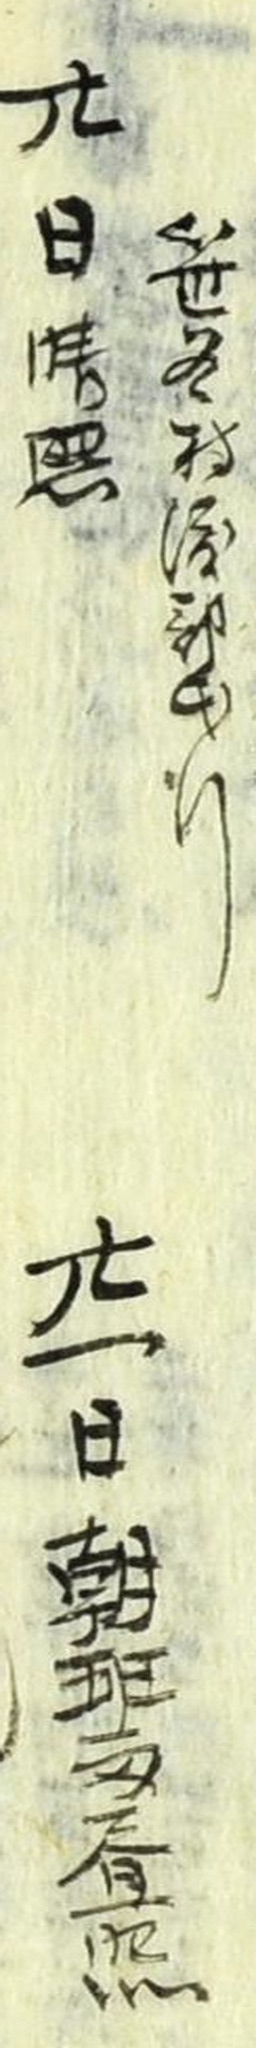廿日晴照廿一日朝班雨昼照
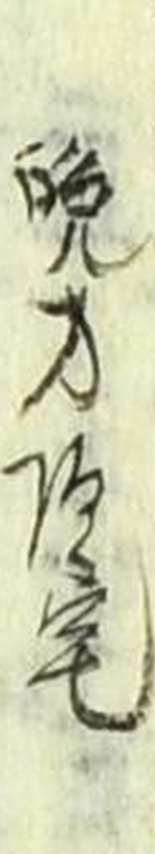晩方帰宅
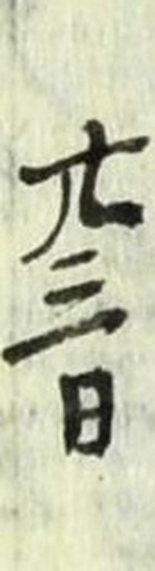廿三日
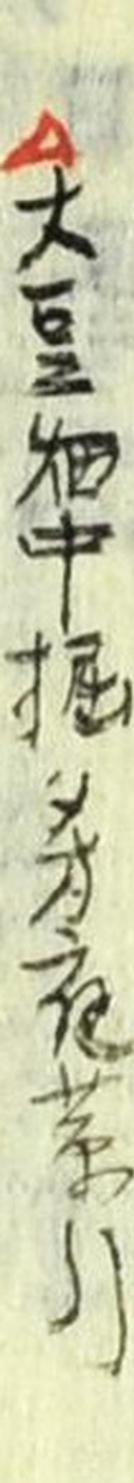大豆畑中掘夕方夜草引
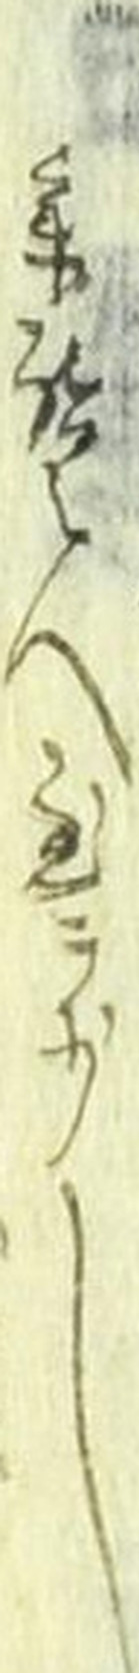参詣之人至テ少し
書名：（日記）
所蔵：福井県文書館 Fukui Prefectural Archives
